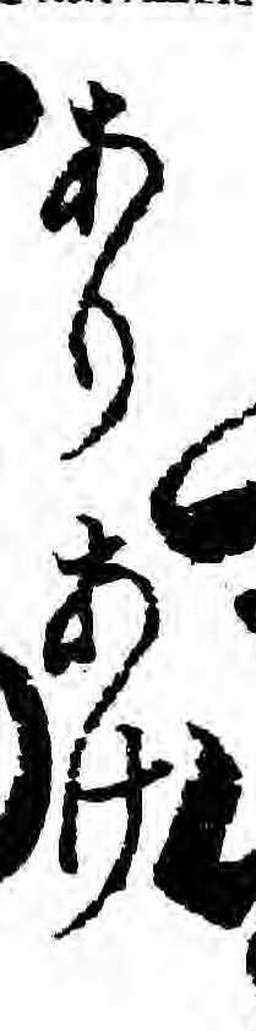ありあけ
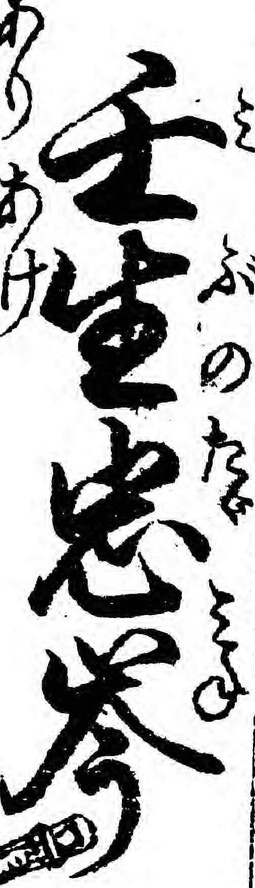壬生忠峯
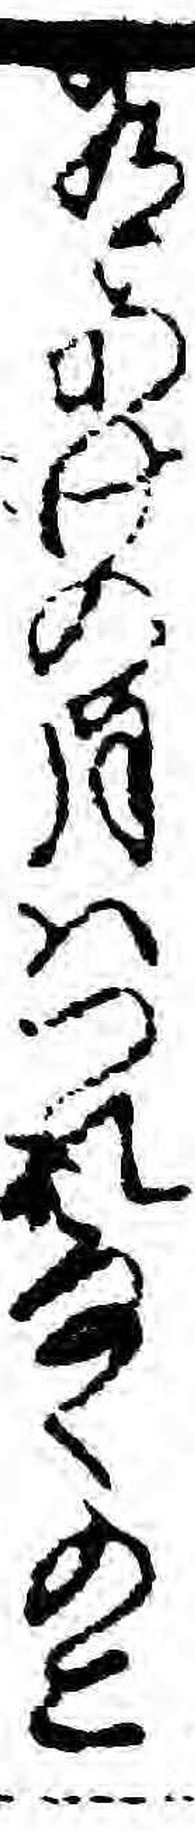有あけの月はつれなくのこ
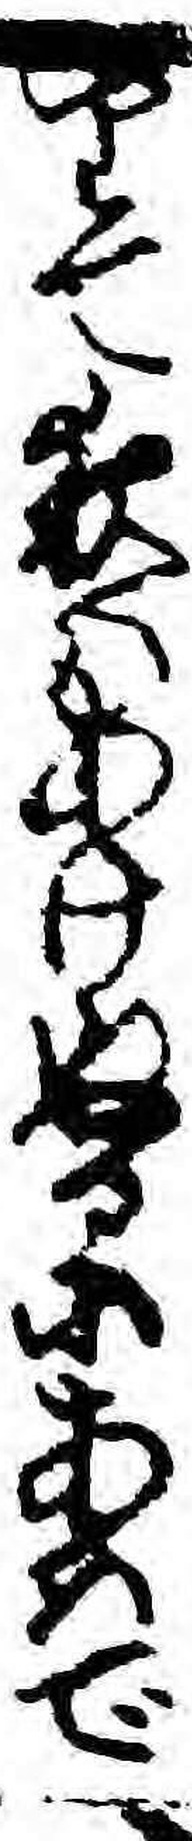りて夜はあけぬるにあはで
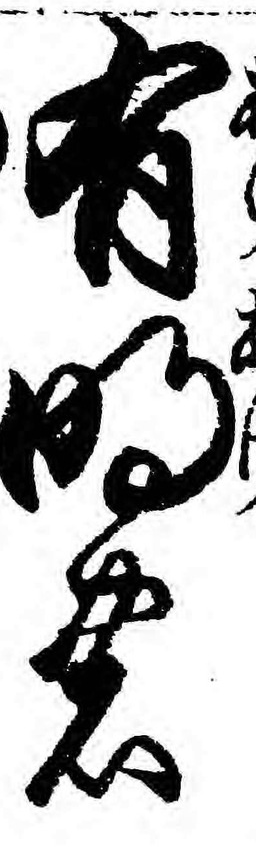有明の
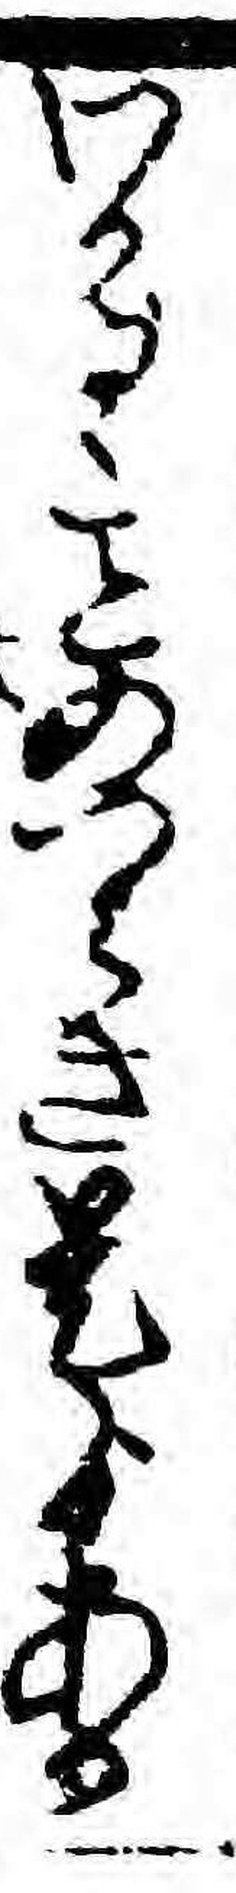わかることのつらさ是ゟあか
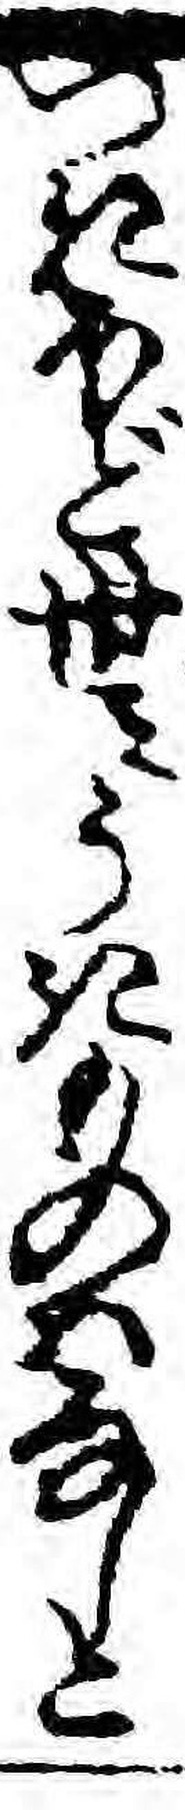つきほど世にうきものはなしと
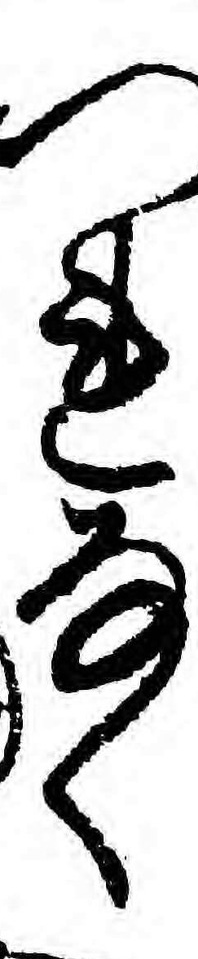つれなく
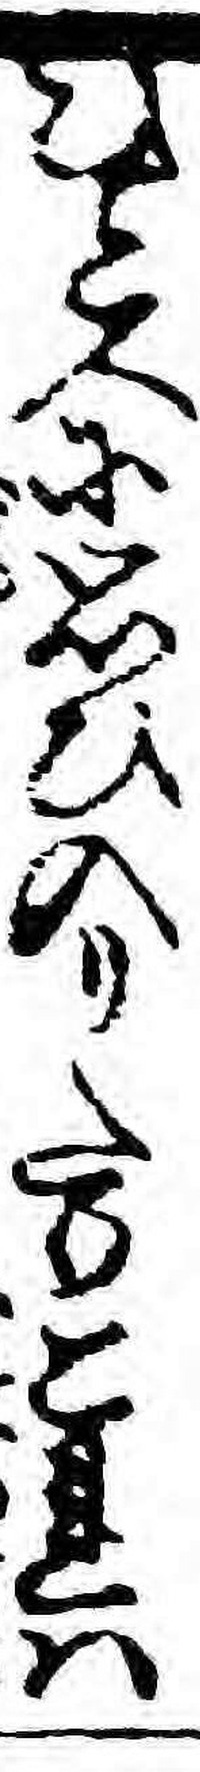ひとへに思ひ入りたりこれは
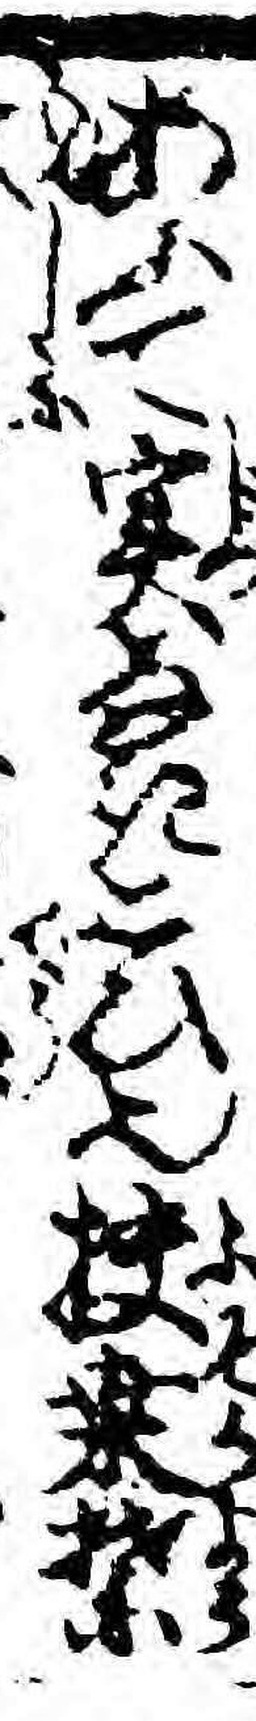あふて実なきこひ也扶桑葉
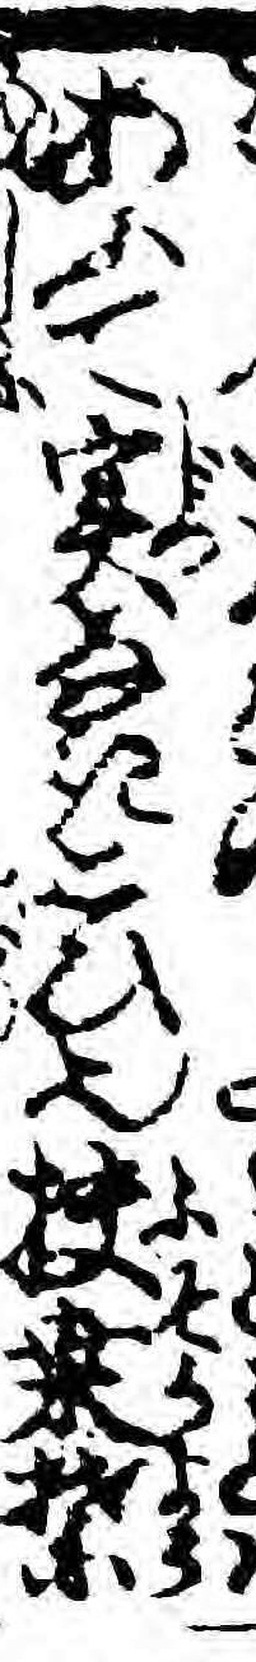あふて実なきこひ也扶桑葉
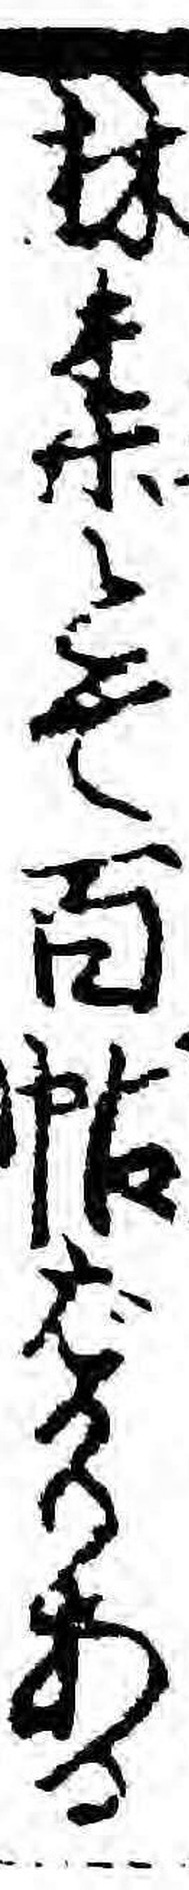林集とて百帖ばかりある
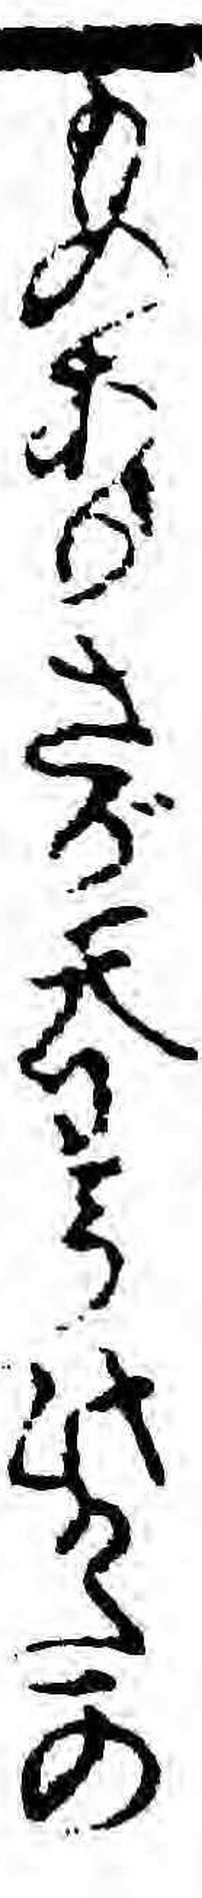ものありさが天わう此かたの
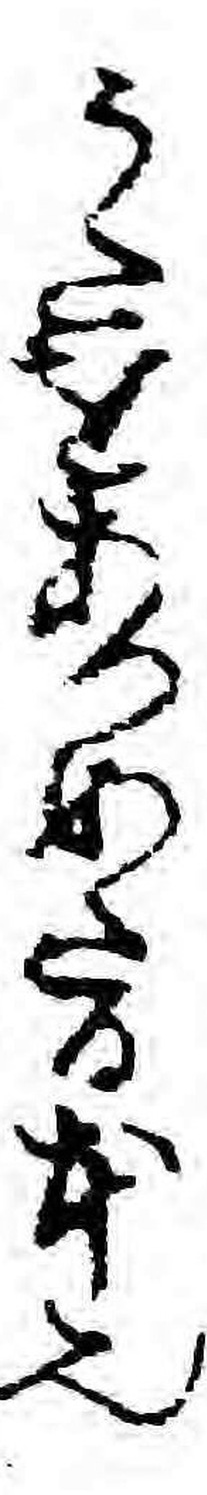うたをあつめたる本也
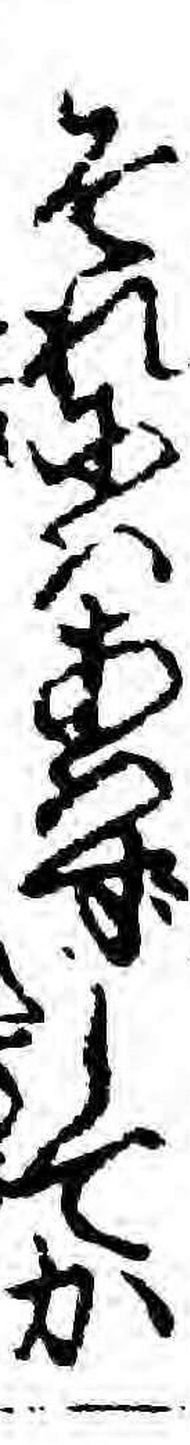それにはあはずしてか
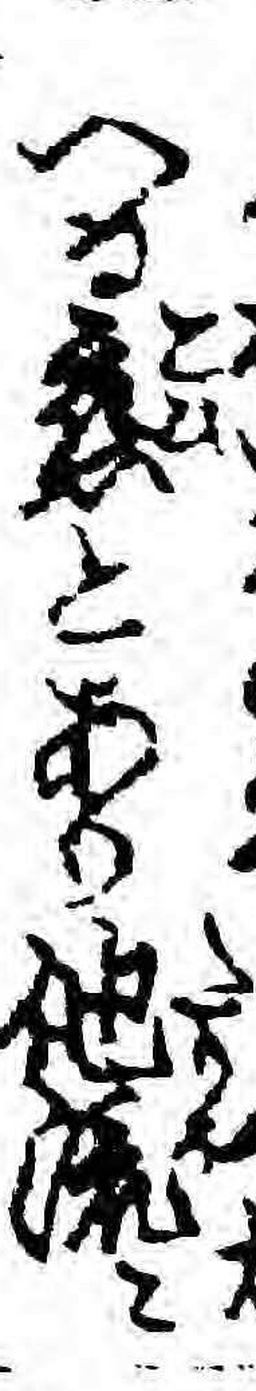へる恋とあり他流に
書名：頭書和歌注譯／壽賀多百人一首小倉錦
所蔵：国文学研究資料館
